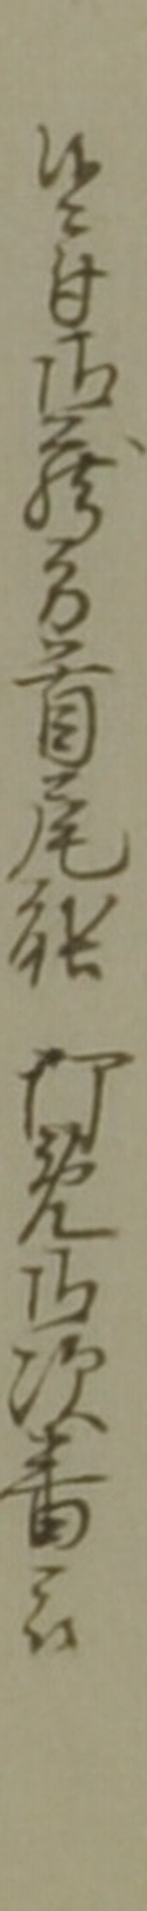候に付御蔵方首尾能御免御次番被
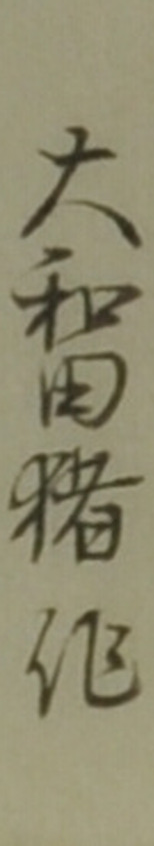大和田猪作
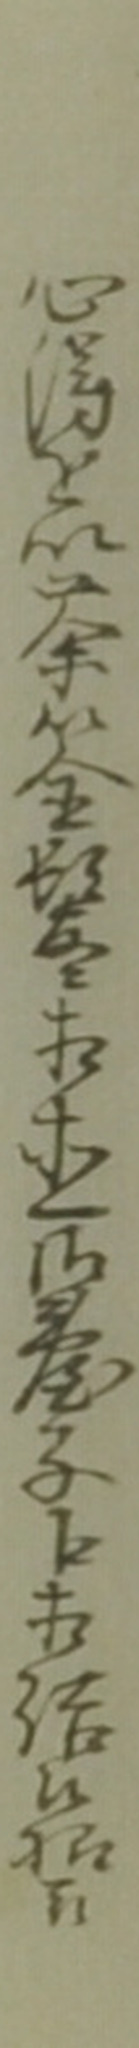心得を以茶筌髪に相直御台子江相詰候様被
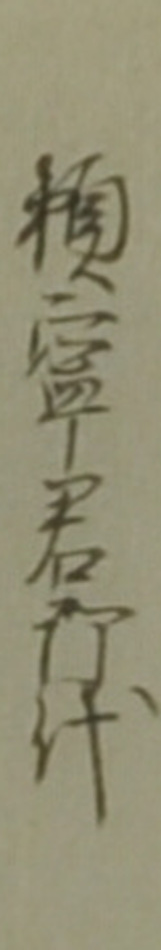頼寧君御代
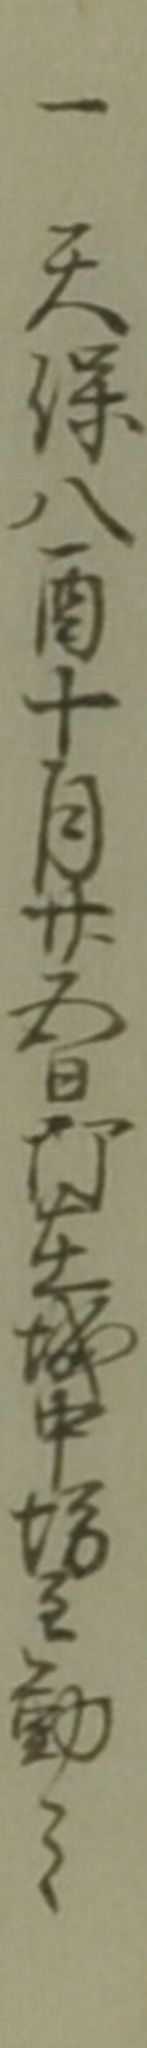一天保八酉十月廿五日御在城中坊主勤之
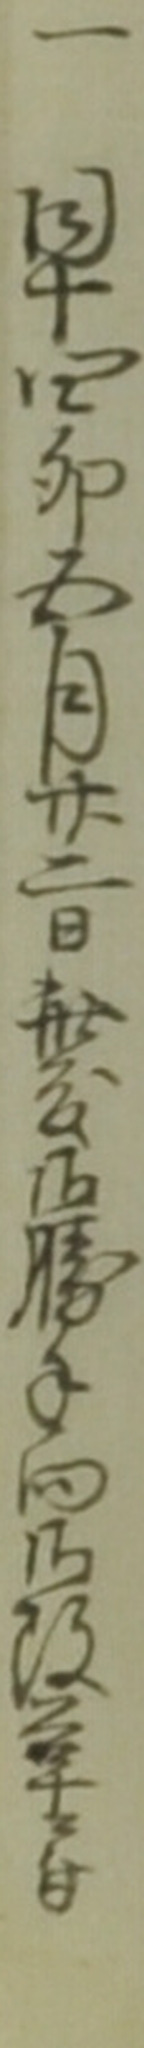一同十四卯五月廿二日此度御勝手向御改革に付

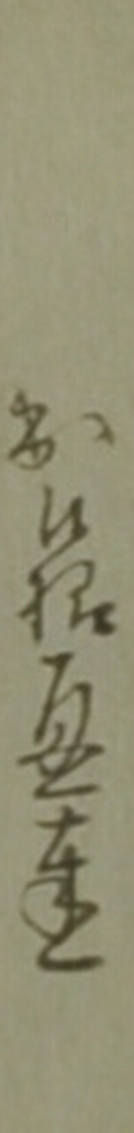出候様通達
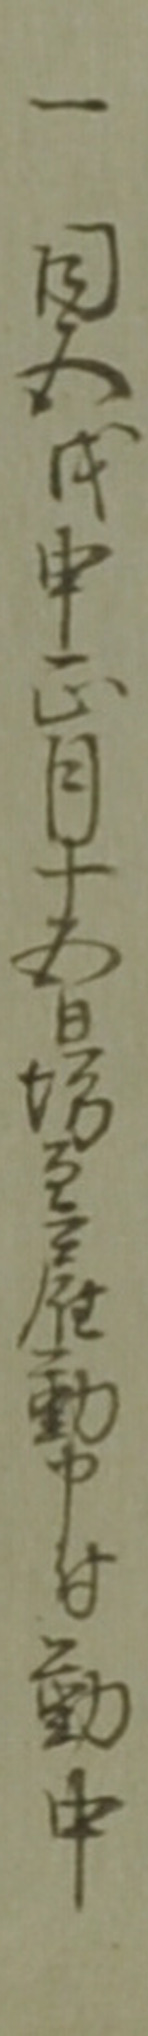一同五戊申正月十五日坊主雇勤申付勤中
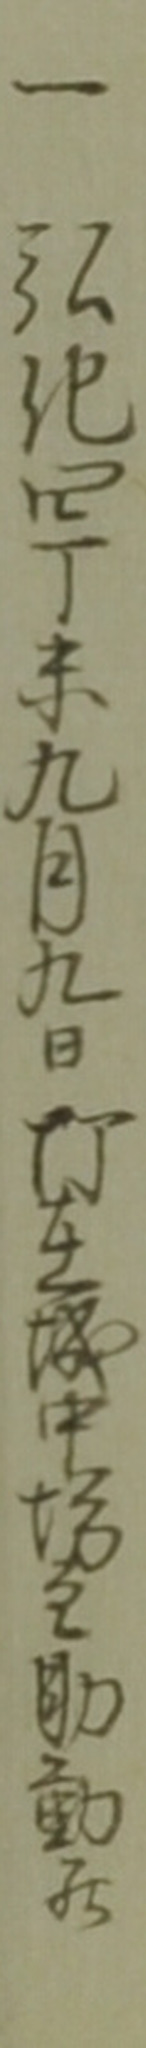一弘化四丁未九月九日御在城中坊主助勤罷
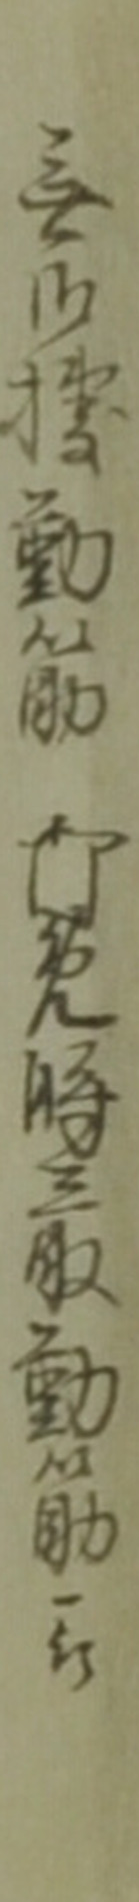無御拠勤筋御免時ニ取勤筋被
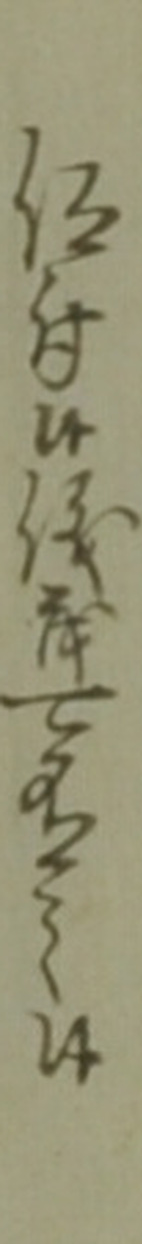仰付候儀も可有之候
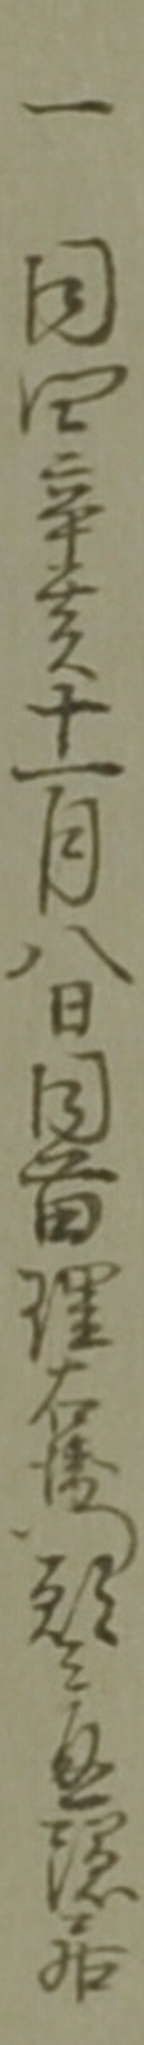一同四辛亥十一月八日同苗理右衛門願之通隠居
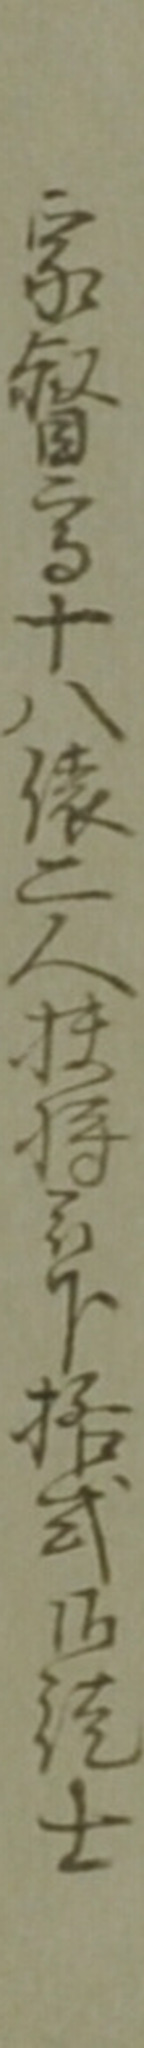家督高十八俵二人扶持被下格式御徒士
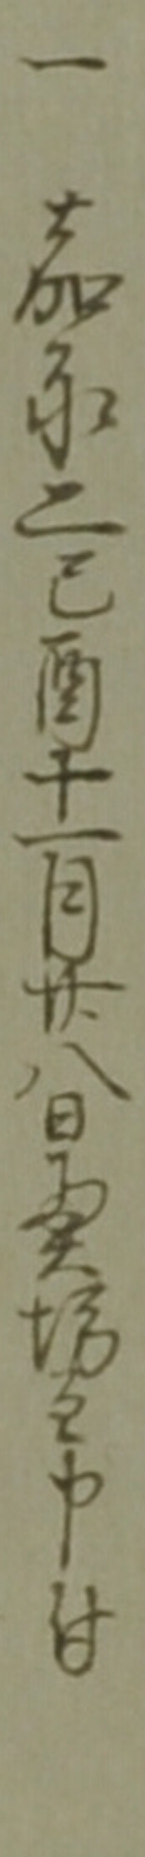一嘉永二己酉十一月廿八日奥坊主申付
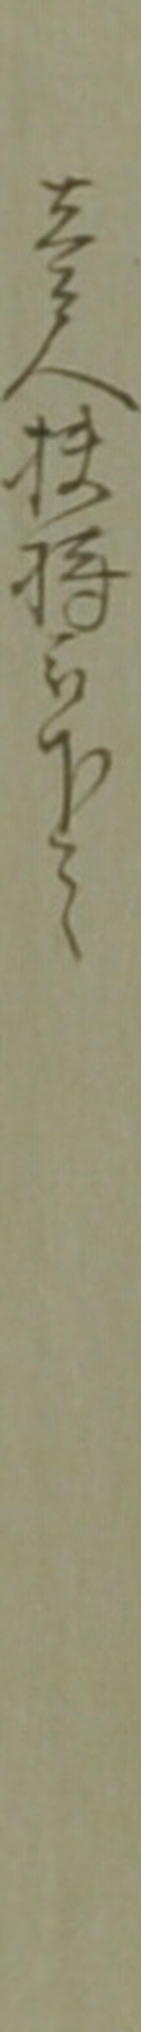壱人扶持被下之

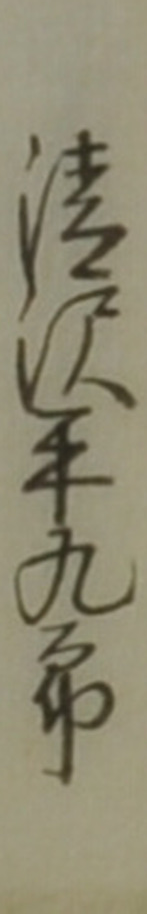清沢平九郎
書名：無足諸士勤仕録（三）
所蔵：伊那市立高遠町図書館・合同会社AMANE
